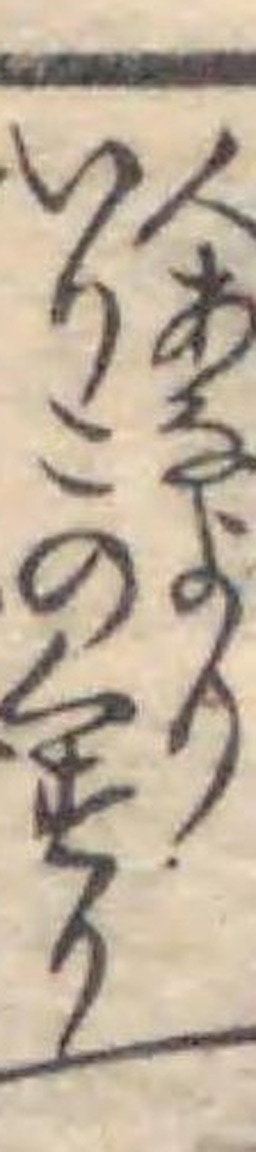いりこのくすり
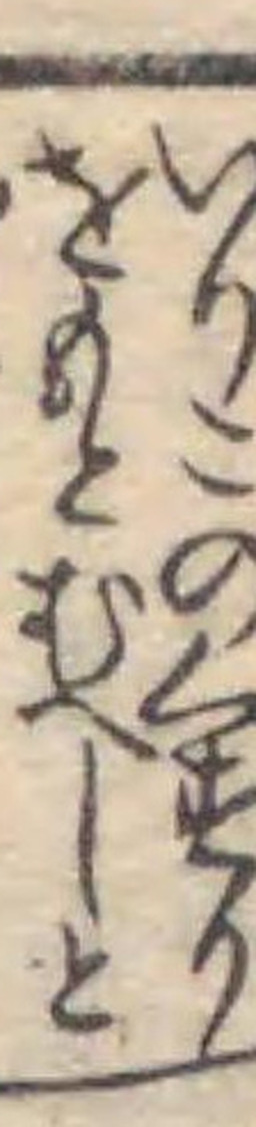をもとむへしと
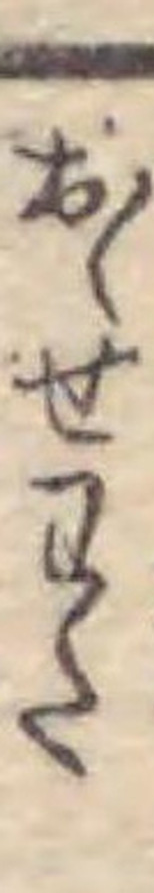おゝせわた
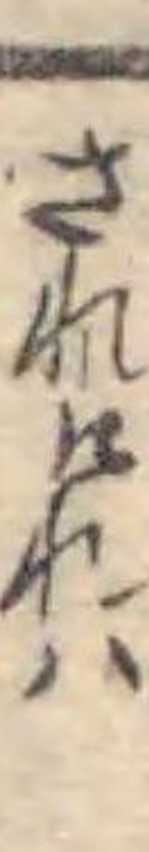されけれは
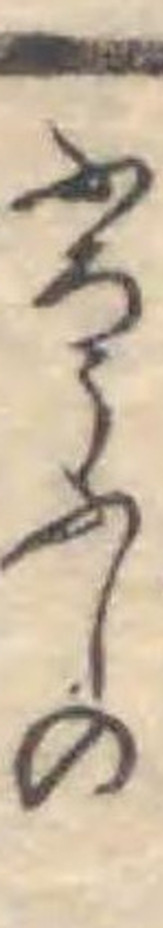ふろうふしの
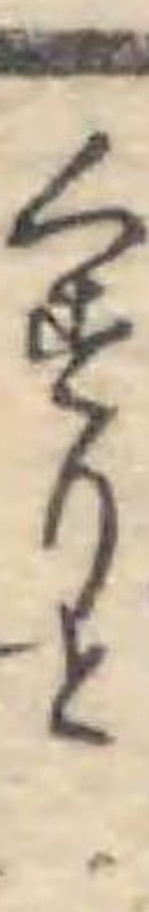くすりと
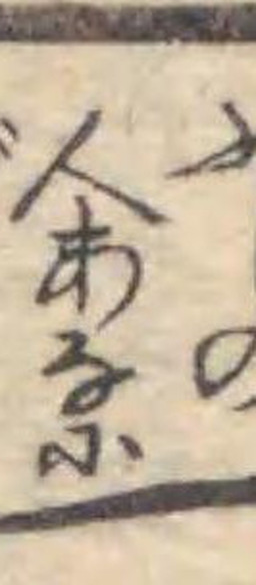人あなに
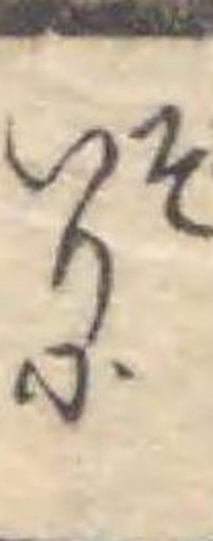いりに
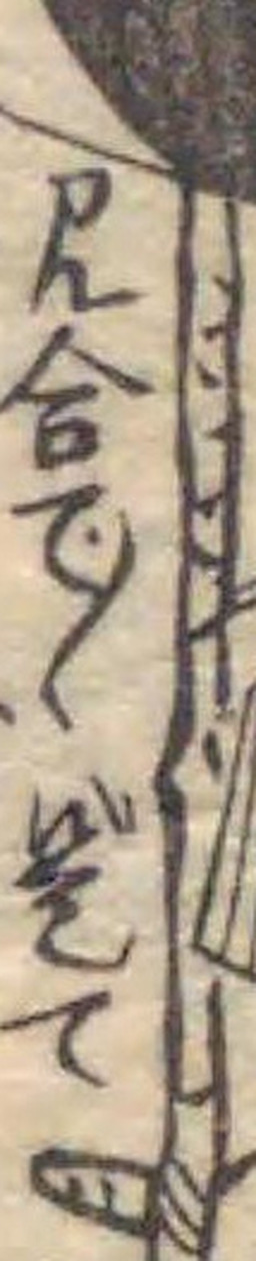見合て〳〵是て
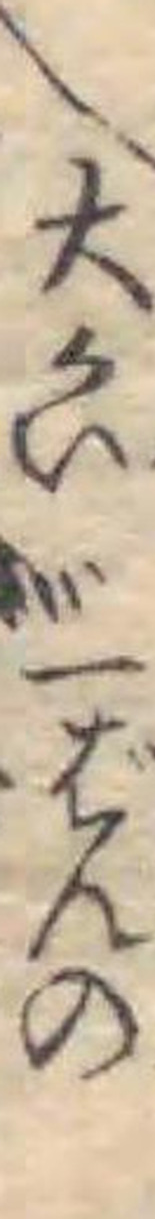大かい一ばんの
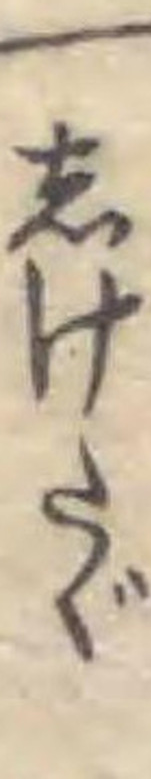しけたゞ
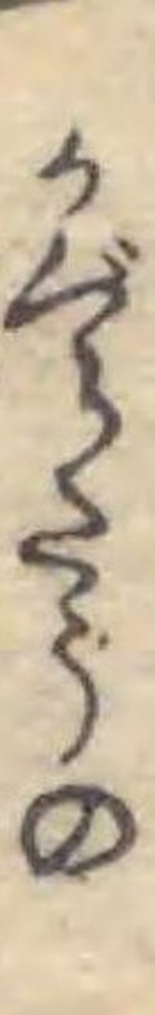かぐらたうの
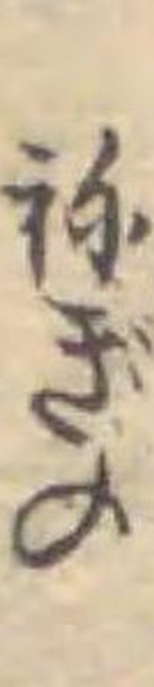ねぎの
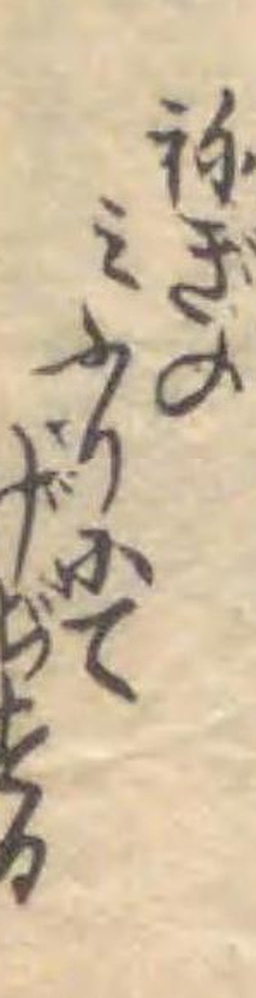みふりにて
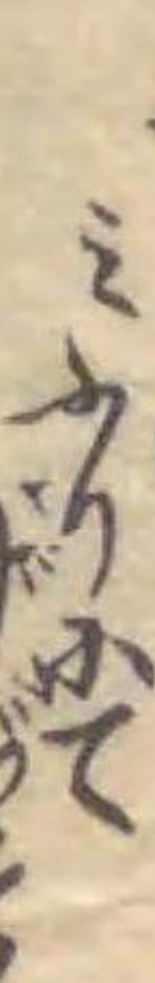みふりにて
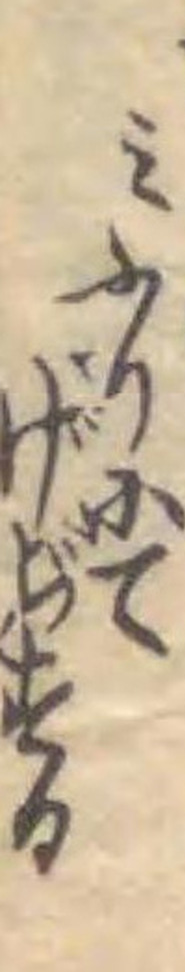みふりにて
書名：文武二道万石通 : 3巻
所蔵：国立国会図書館 National Diet Library, JAPAN
